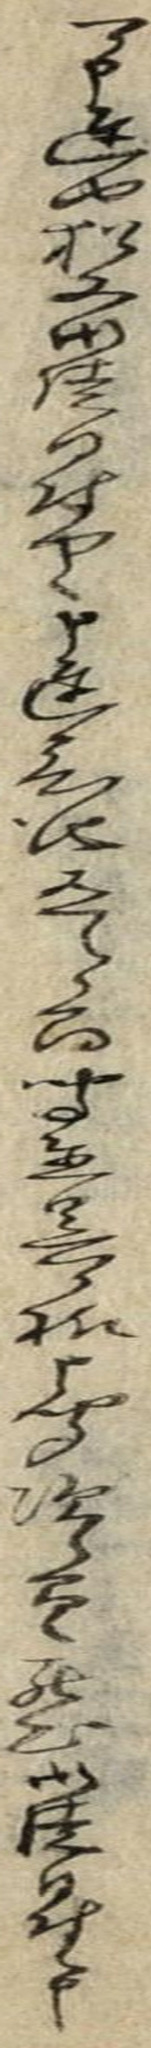可申達候由猶又御徒目付中へ申達度儀有之候間聞置呉候様申聞次之間へ罷出御徒目付へ申
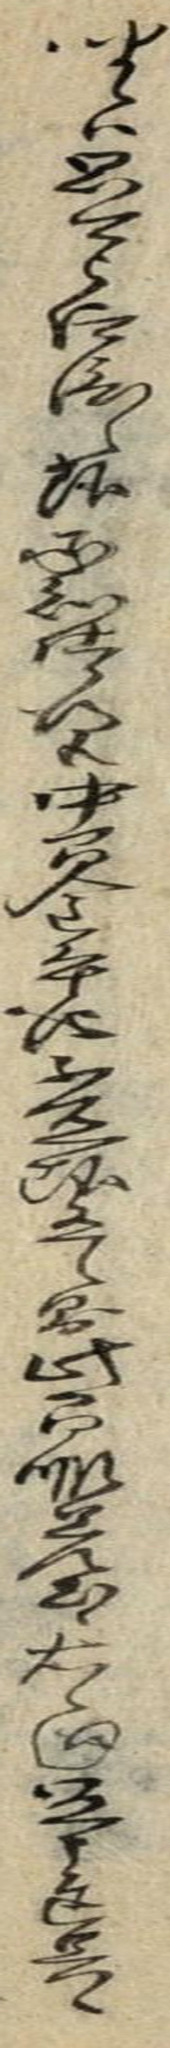聞候は只今被申渡候趣承知仕候得共中間金平儀不宜趣有之則此間暇差出候右之趣宜申達呉候
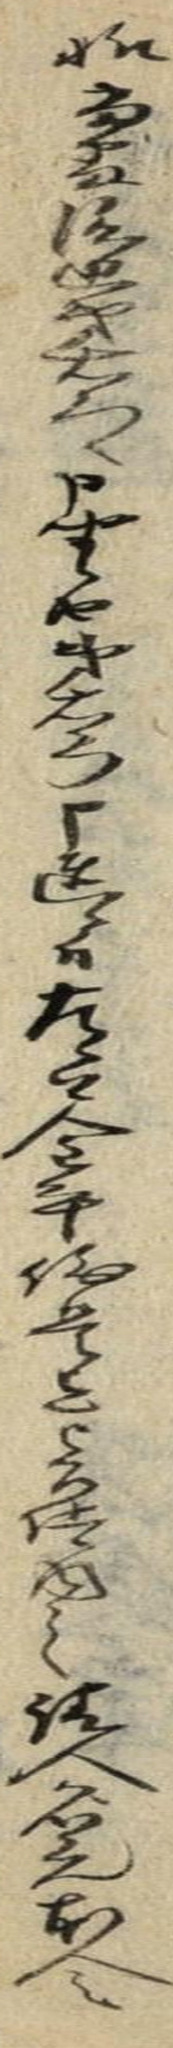様当番渡辺第右衛門へ申聞候由第右衛門申達候に付左候はゝ金平儀是迄被召仕候内之請人名元本人之
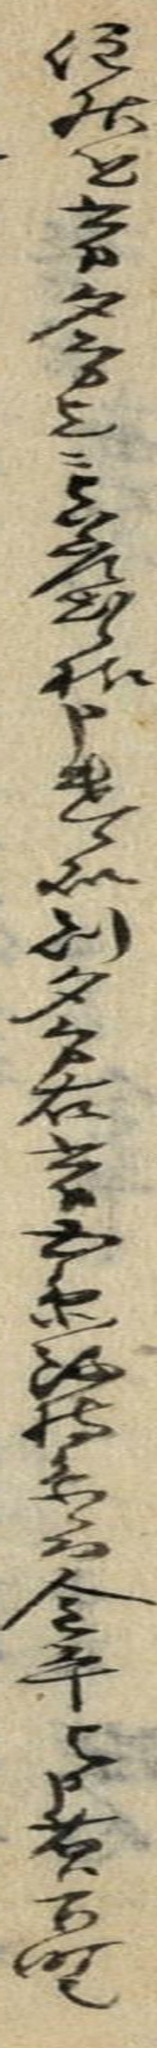住居を書付夕方迄に被差出候様申遣候処則夕方右書付五兵衛致持参候而金平と申者は下町之
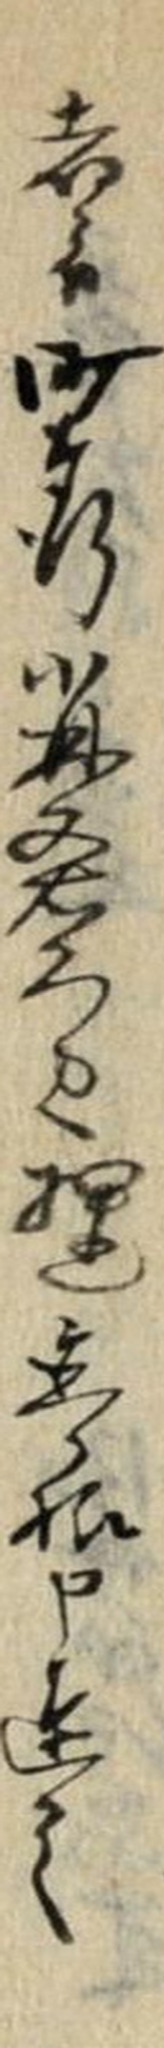者に付町奉行小林又右衛門方へ押込置候様申達之
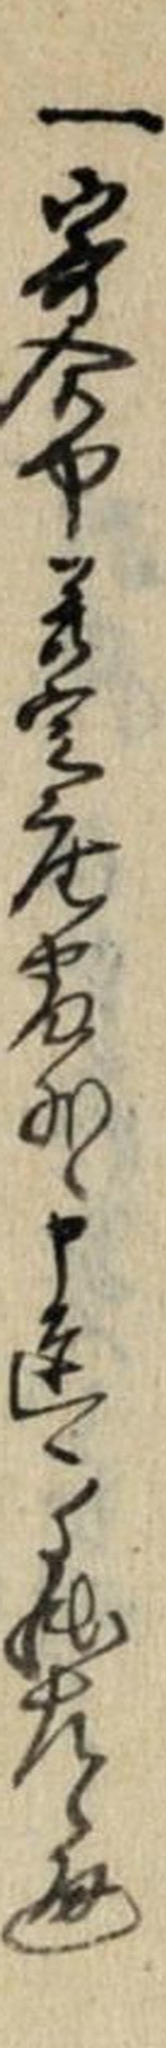一寄合中并定座番外へ申達候手紙左之通
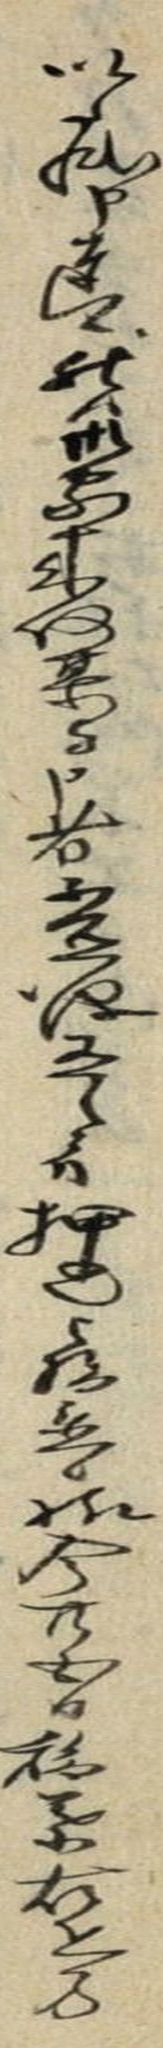以手紙申達候然は御家来何某と申者不宜儀有之候に付押込被指置候様今廿五日稻葉右近方
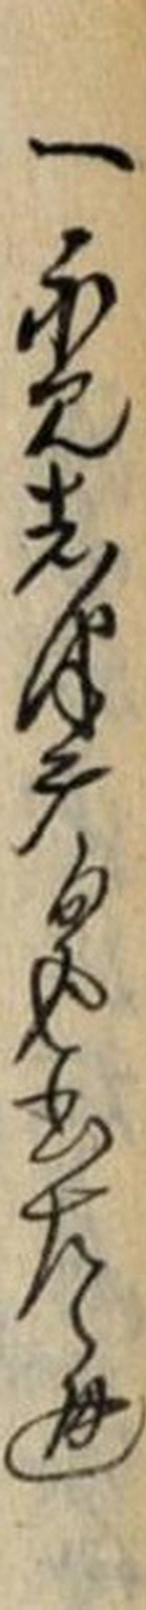一永見志津摩ゟ返書左之通
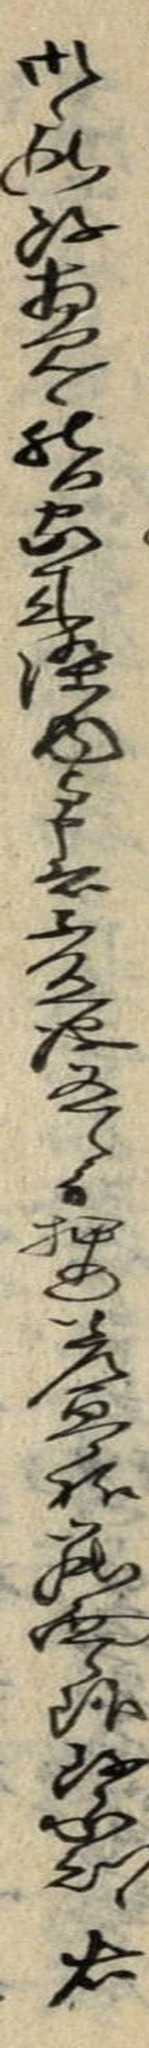御手紙致拝見候然は家来染内と申者不宜儀有之付押込差置候様御紙面之趣致承知候右
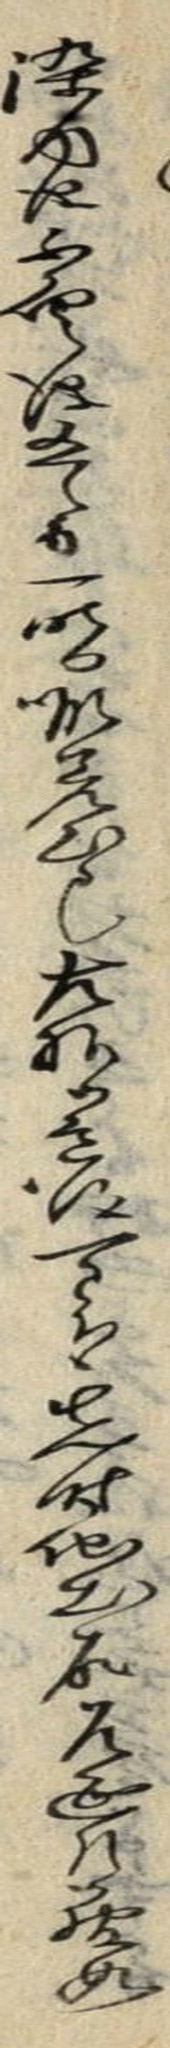染内儀不届之儀有之ニ付一昨日暇差出申候左様可意得可被下候先時他出故乍延引御報如
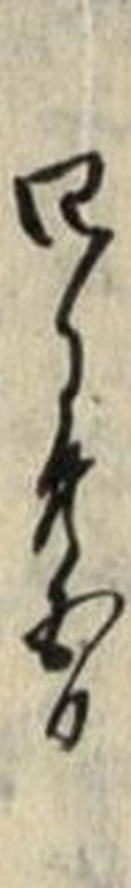四月廿五日
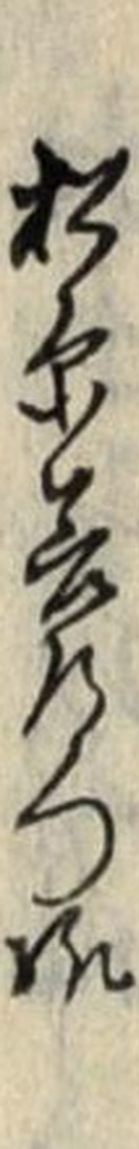誰殿松原善左衛門
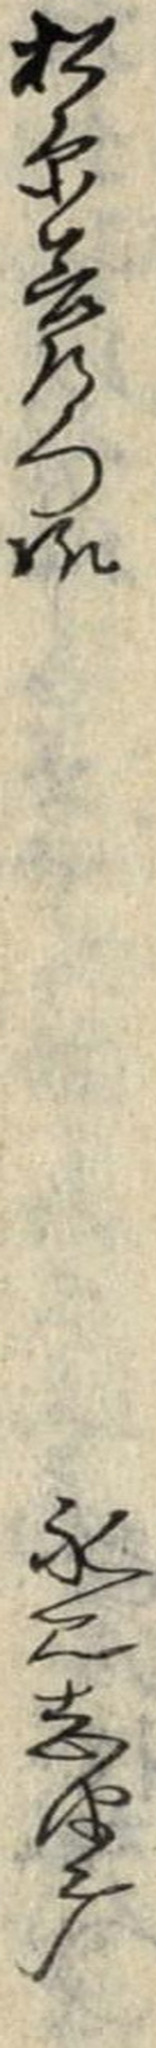松原善左衛門様永見志津摩
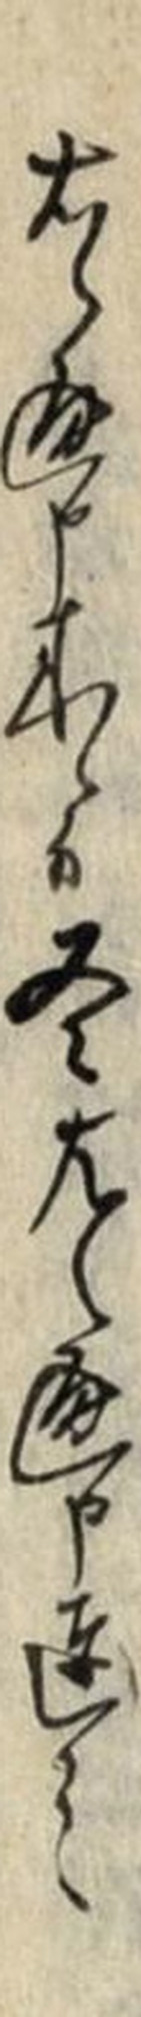右之通申来候付又々左之通申達之候
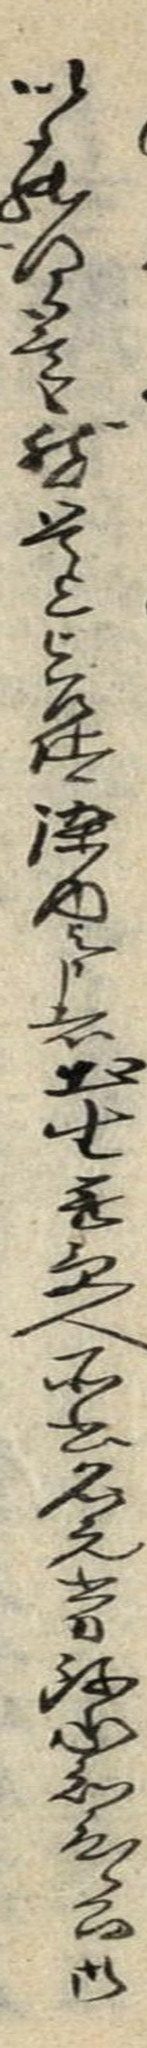以手紙得御意候然は是迄被召仕候染内と申者出生并受人所書名元書付致承知度候間御
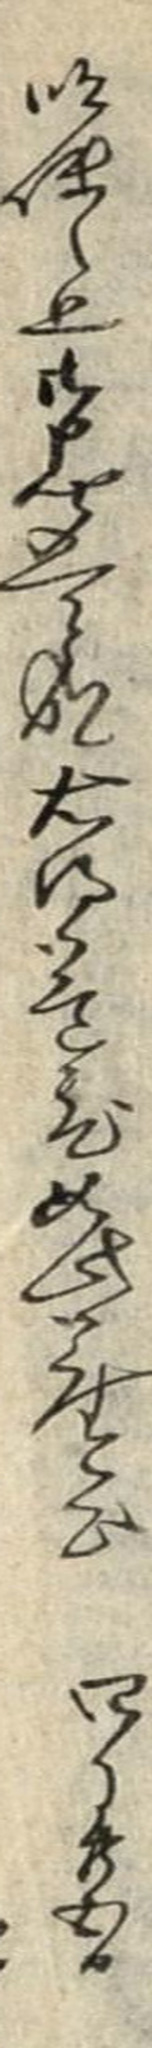吟味之上御申聞可被成候右得御意度如此御座候以上
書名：蒐輯之部
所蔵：福井県文書館 Fukui Prefectural Archives
